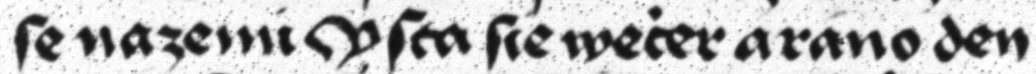ſe na zemi Y ſta ſie weċer a ráno den
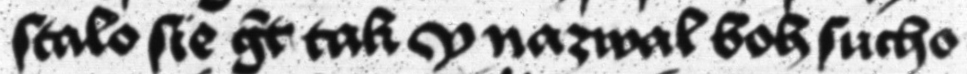ſtalo ſie ḡt tak Y nazwal boh ſucho
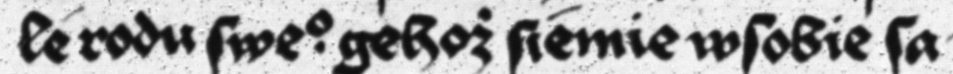lé rodu ſwe°. gehoż ſíemie wſobie ſa
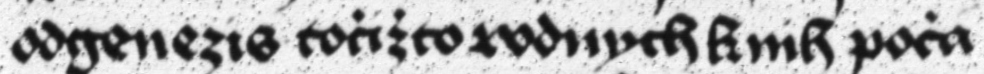odgenezis toċiżto rodnych knih poċa
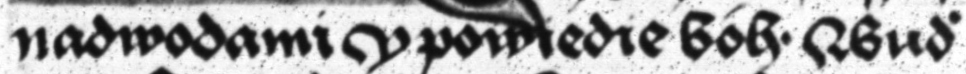nadwodami Y powiedie bóh. Buḋ
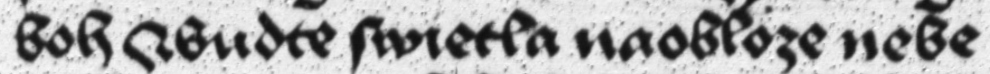boh Budte ſwietla na obloze nebe
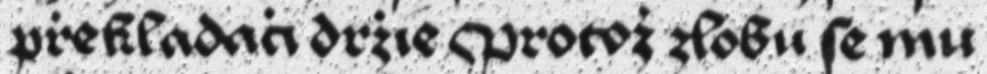pṙekladaċi drżíe Protoż zlobú ſe mu
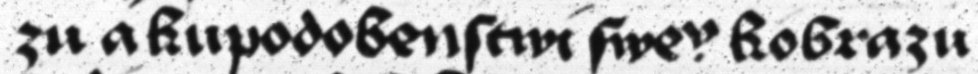zu a kupodobenſtwí ſwev kobrazu
